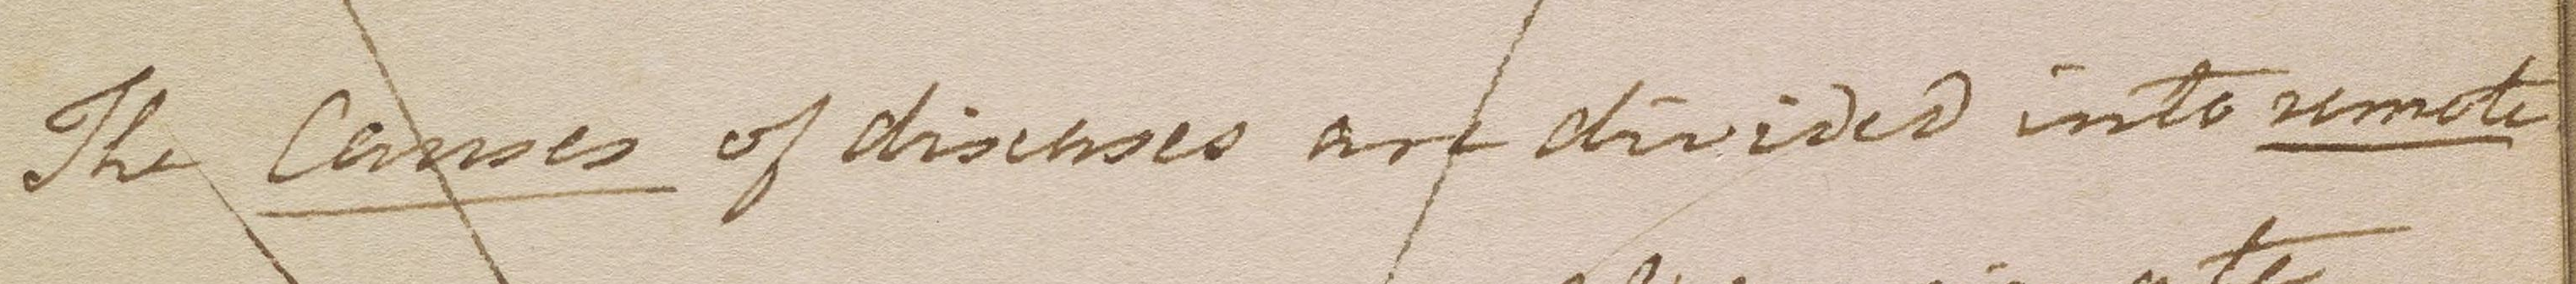The causes of diseases are divided into remote,
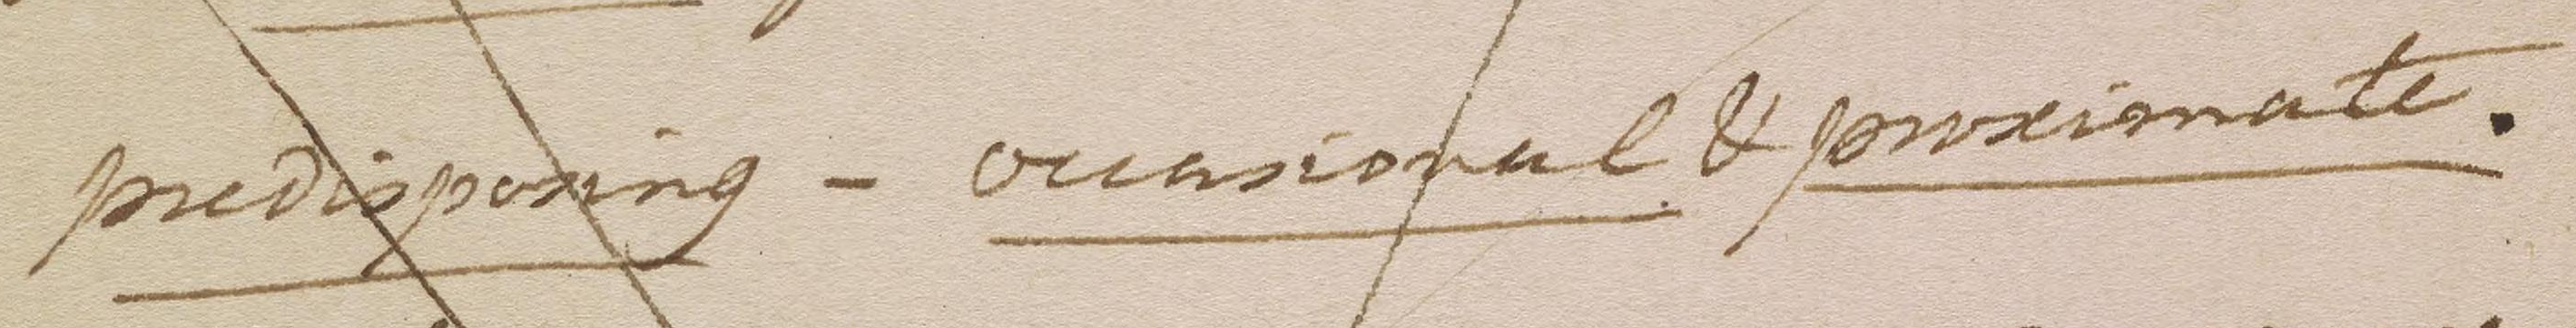predisposing- occasional & proximate.
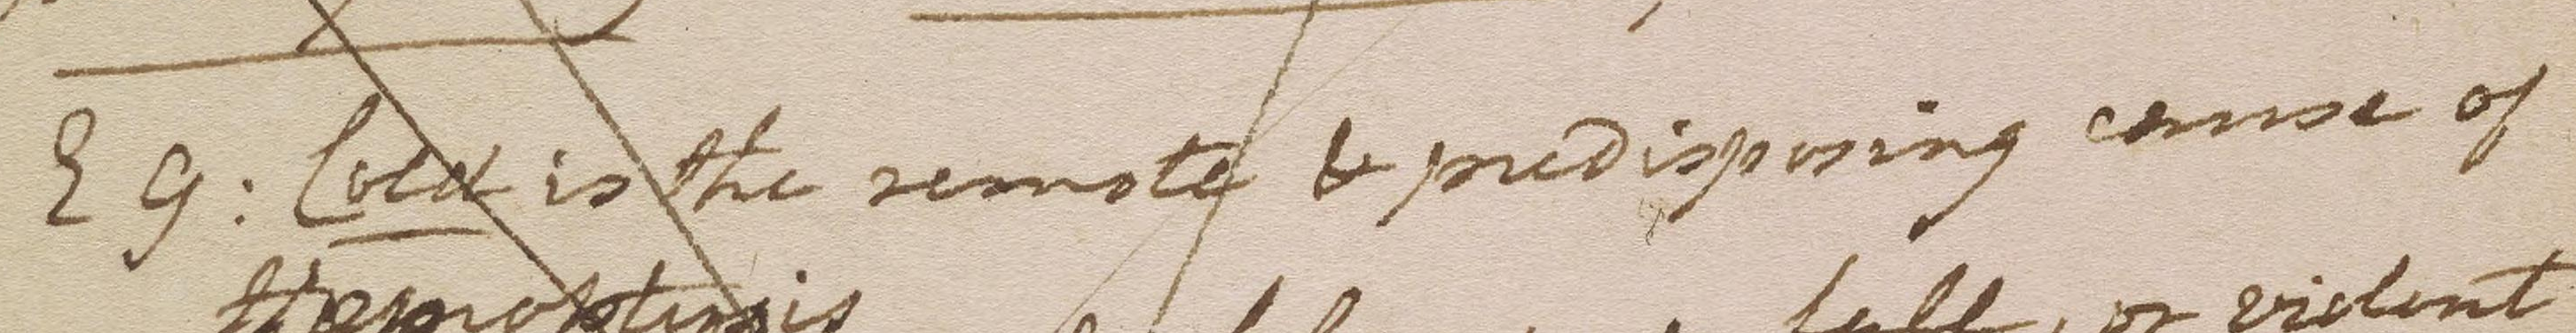E.g: Cold is the remote & predisposing cause of
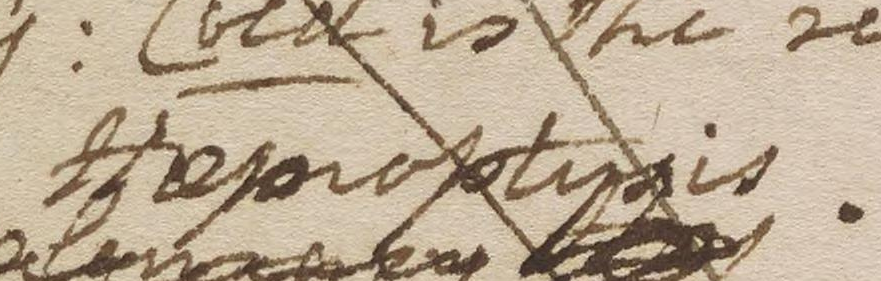Heproptisis
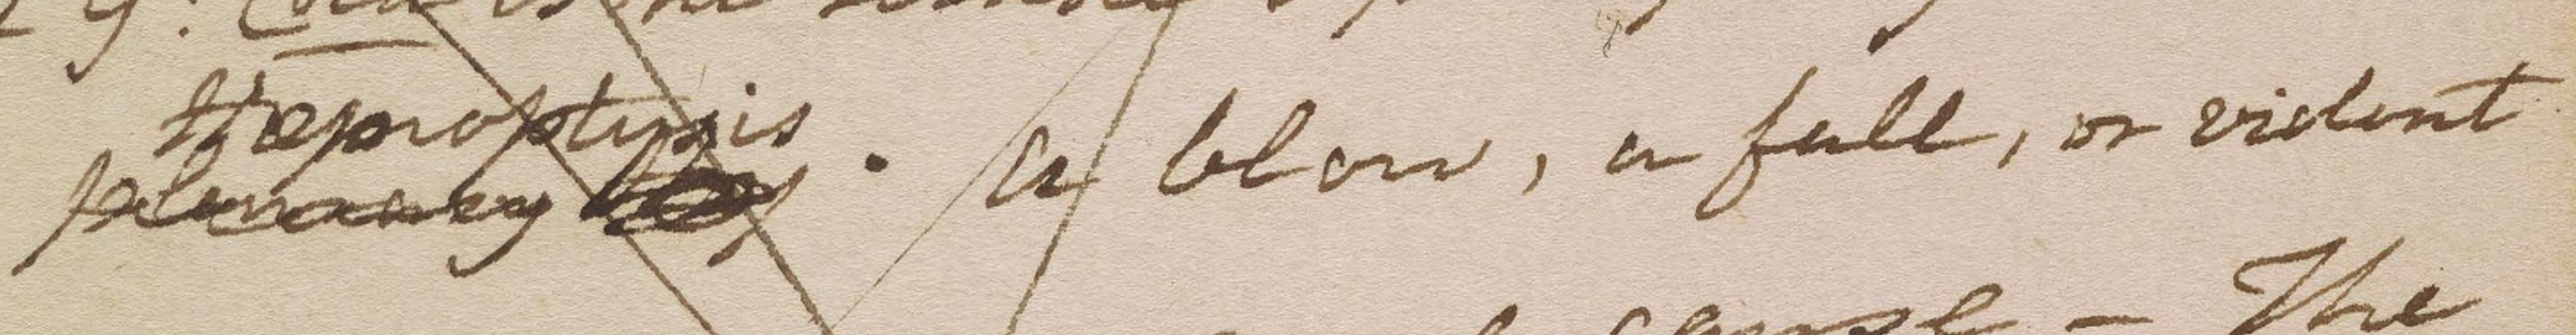[pleurasy] [____]. A blow, a fall, or violent
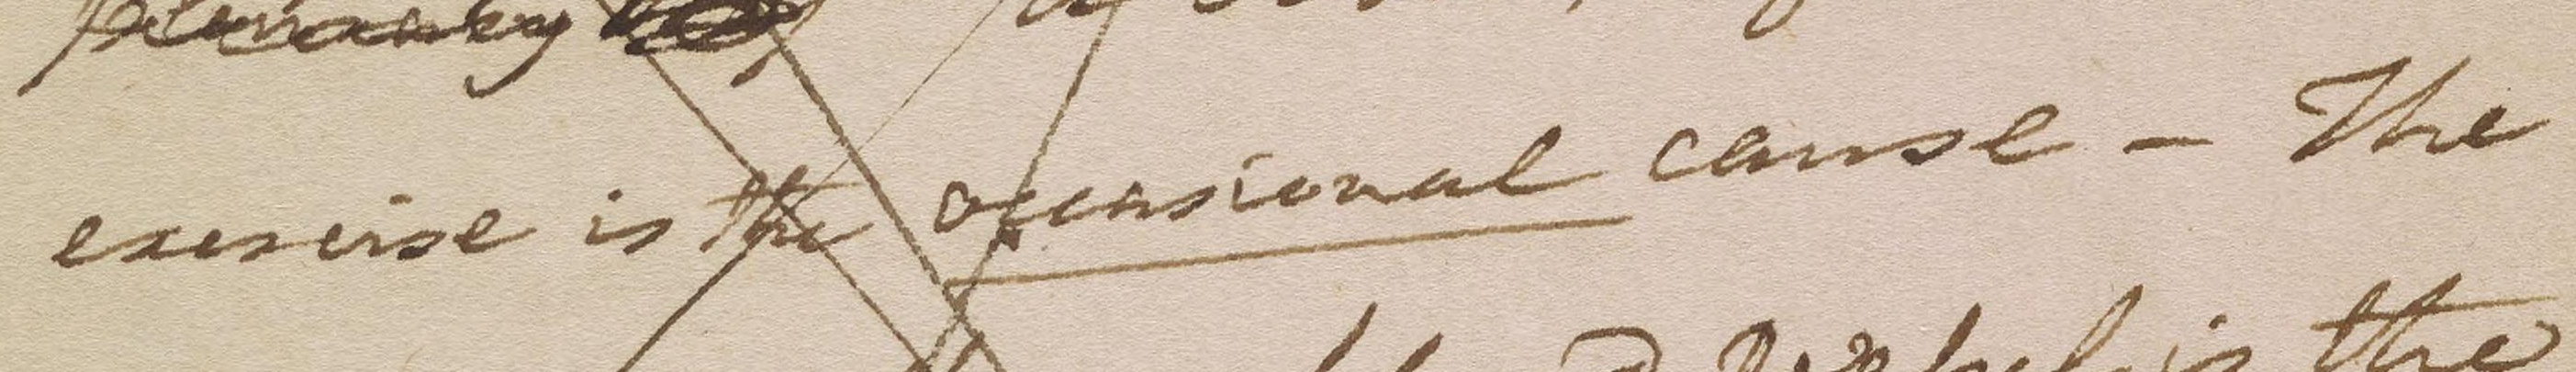exercise is the occasional cause. The
